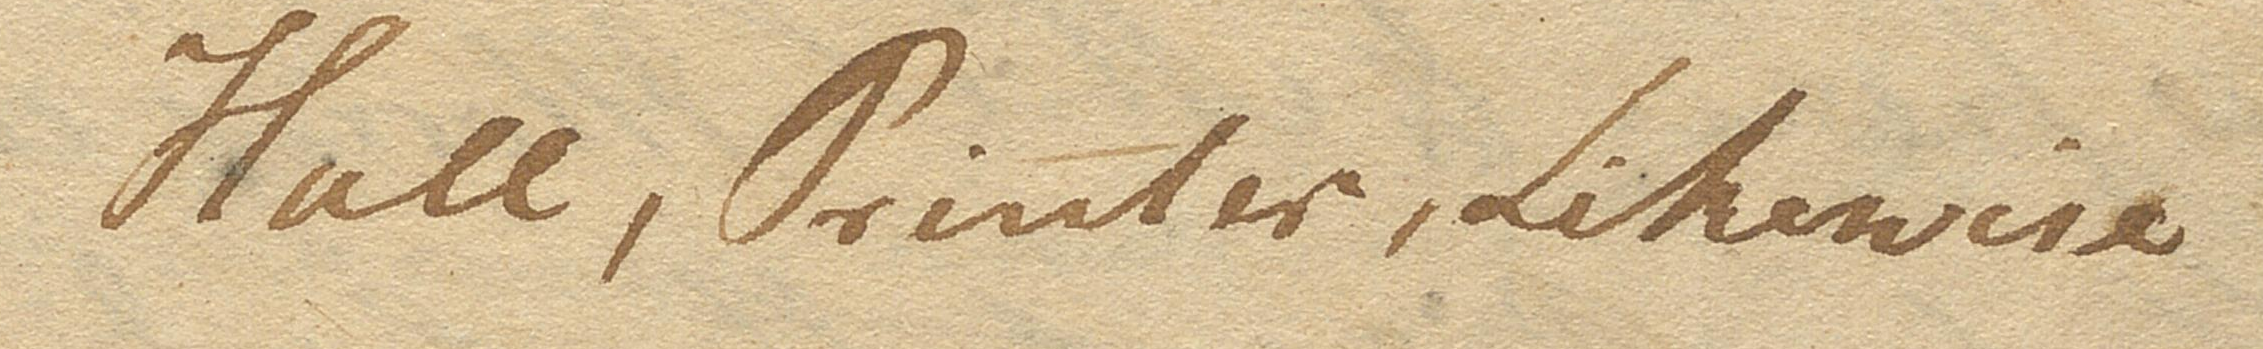Hall, Printer, Likewise
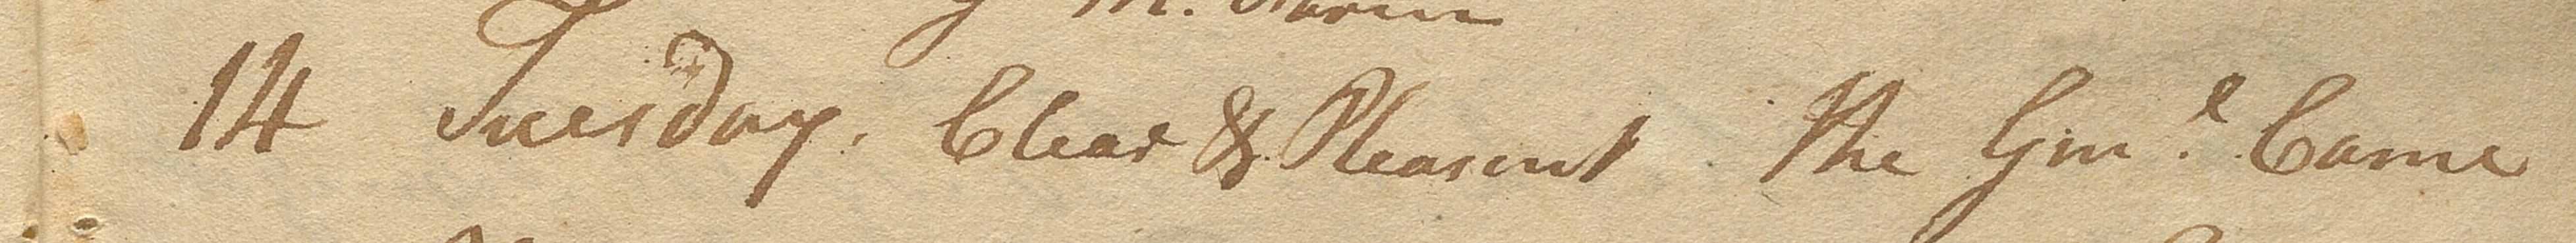14 Tuesday. Clear & Pleasent the Gen^l. Came
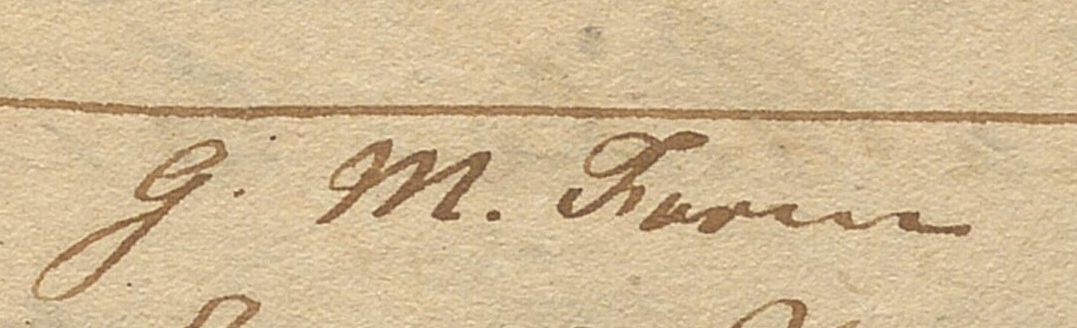G. M. Farm
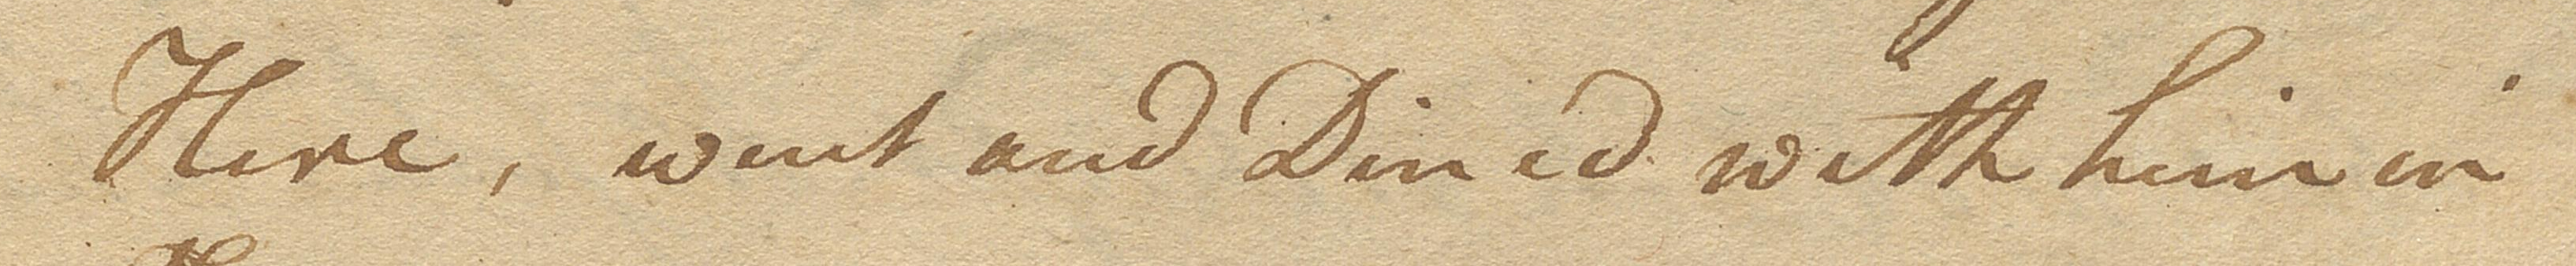Hire, went and Dined with him in
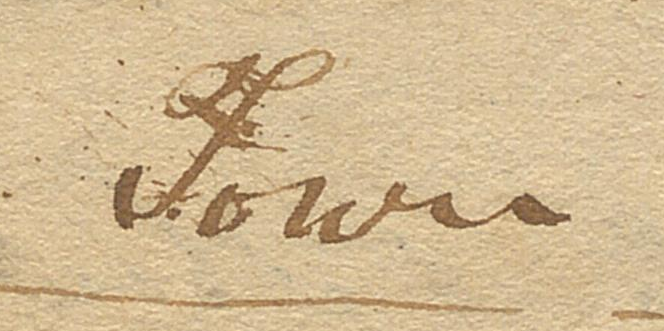Town
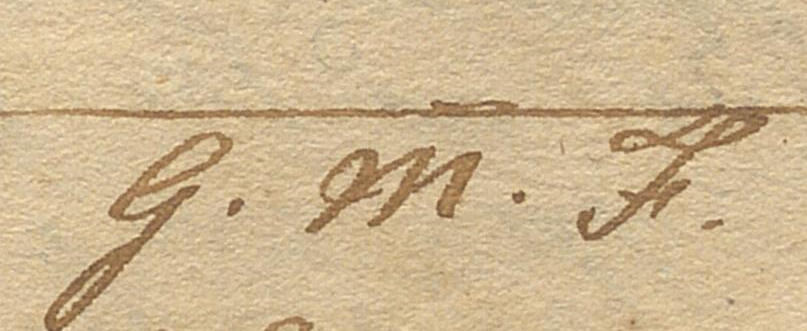G. M. F
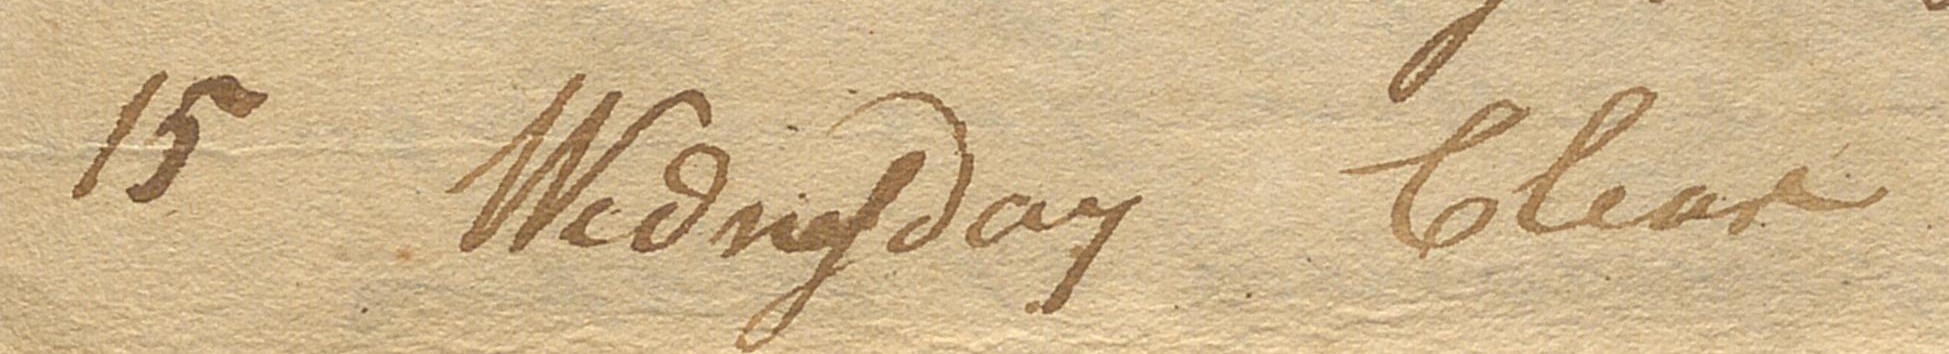15 Wednsday Clear
